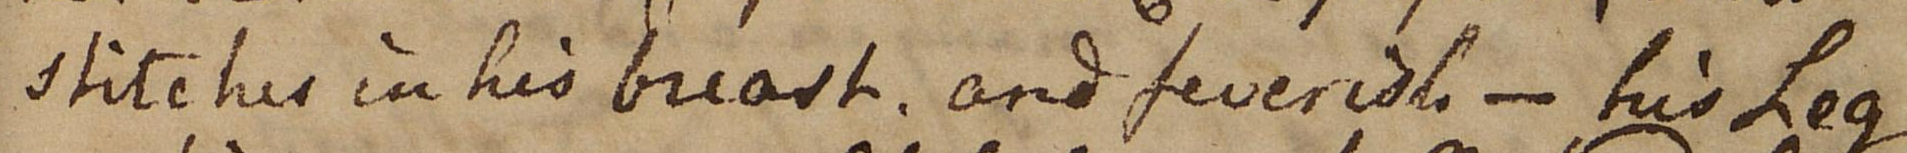stitches in his breast, and feverish- his Leg
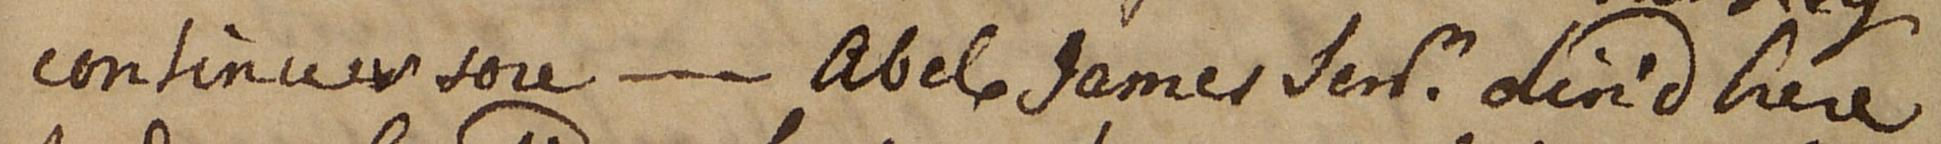continues sore- Abel James sen^r. din'd here
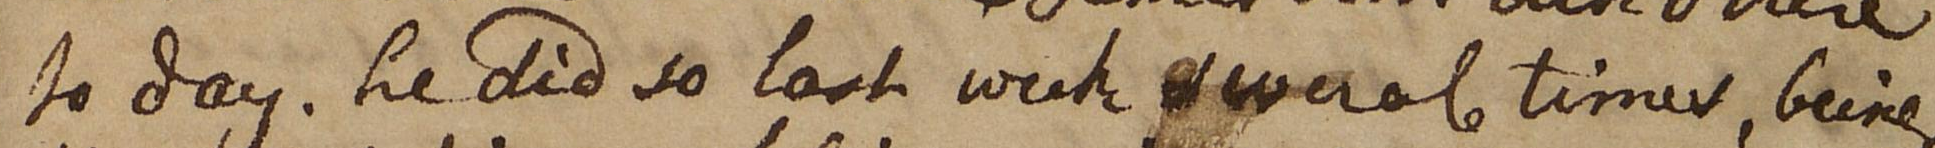to day. he did so last week several times, being
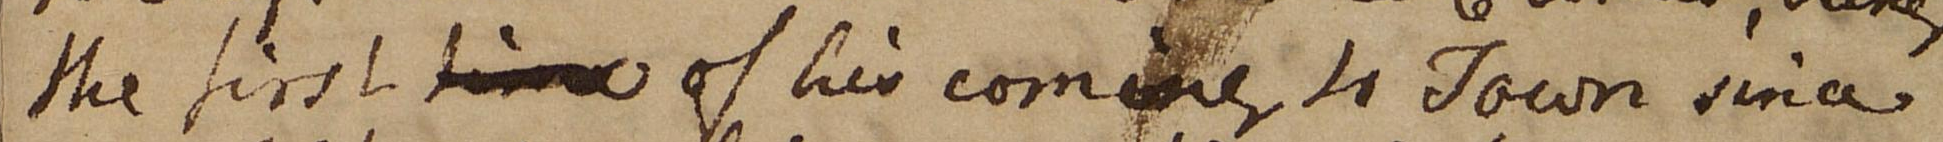the first [time] of his coming to Town since
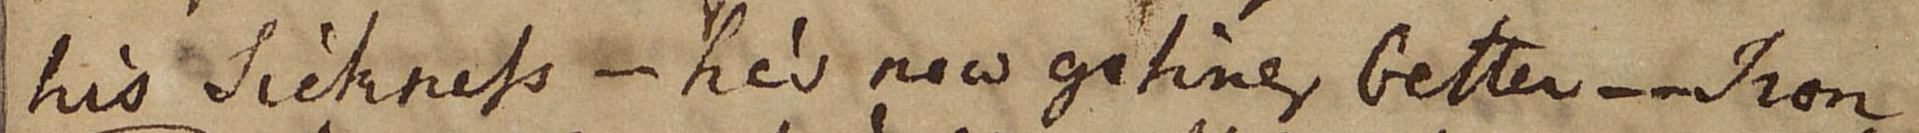his Sickness- he's now geting better- Iron
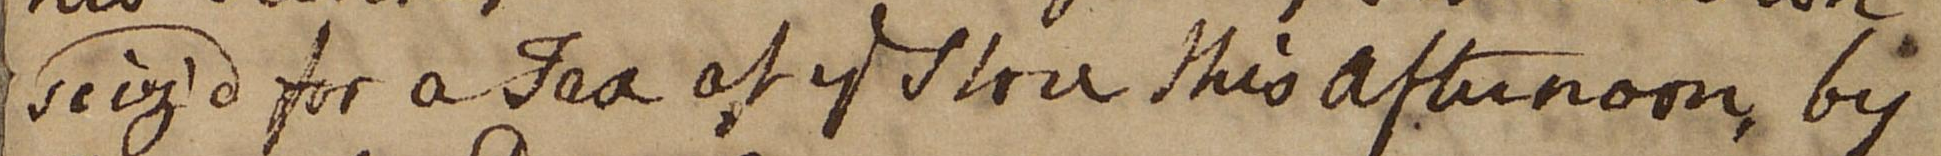seiz'd for a Tax of y^e store This afternoon, by
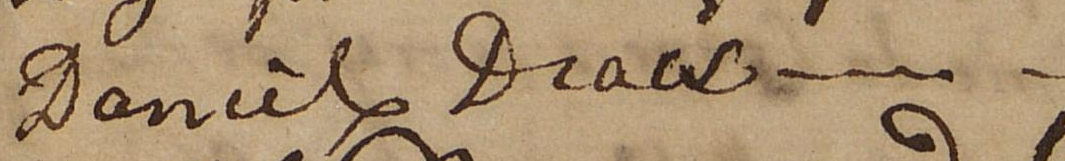Daniel Drace--
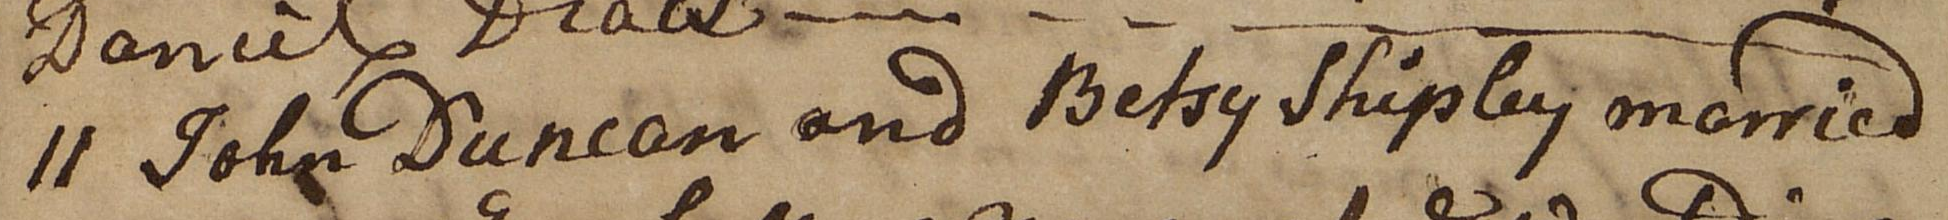11 John Duncan and Betsy Shipley married
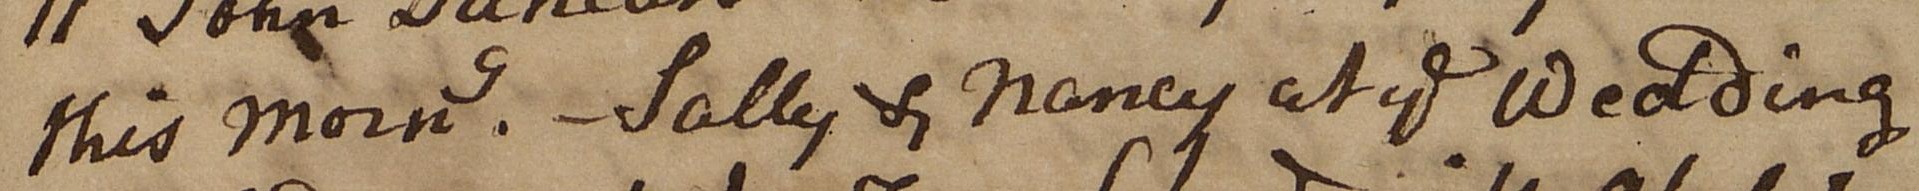this morn^g.- Sally & Nancy at y^e Wedding
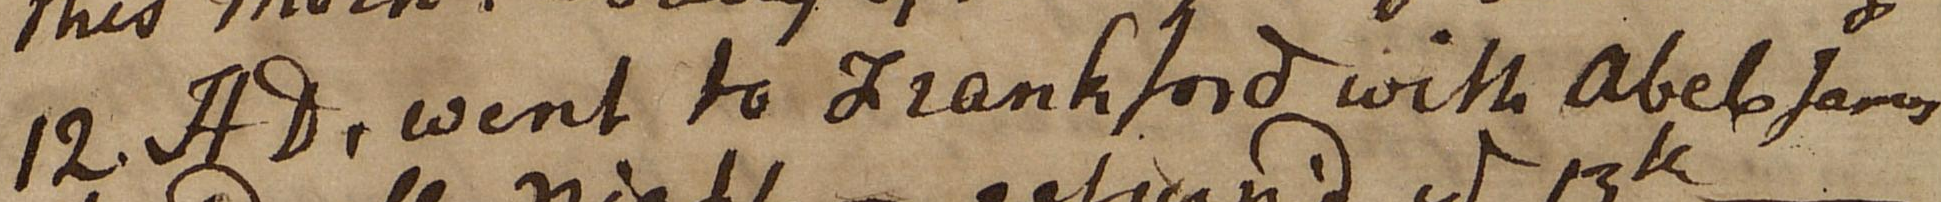12. HD. went to Frankford with Abel James
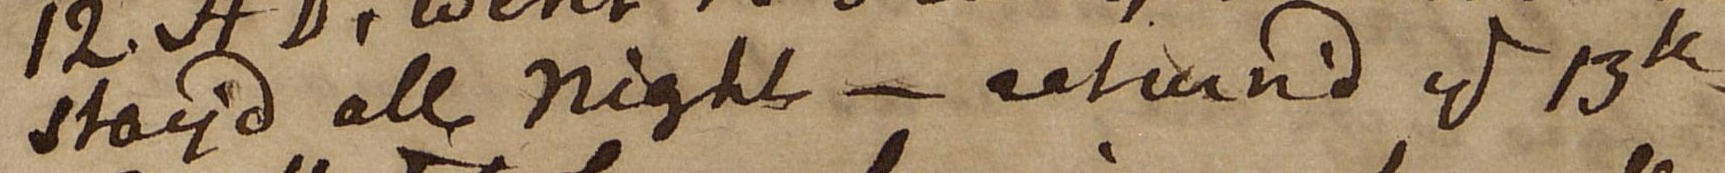stay'd all Night- return'd y^e 13^th-
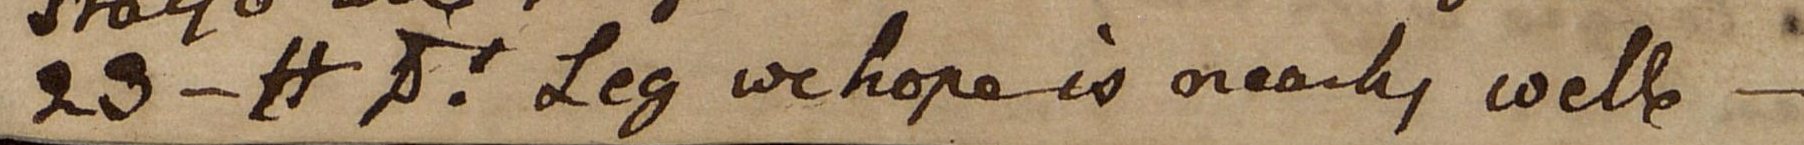23- HD^s. Leg we hope is nearly well-
